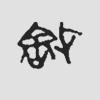{舍攴}
